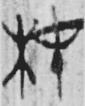材
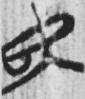𡚦（焉）
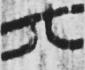亓（其）
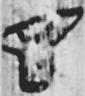言
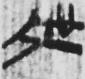吝（文）
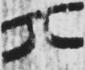亓（其）
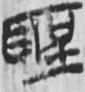聖（聲）
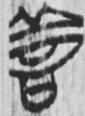善
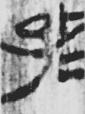孔子
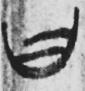曰
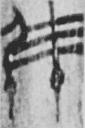隹（惟）
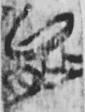能
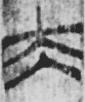夫
